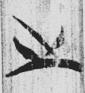之
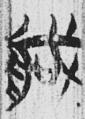○（莊）
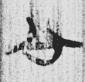公
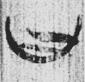曰
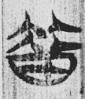昔
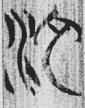池
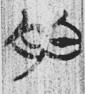舶
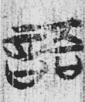語
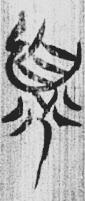○（寡）
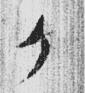人
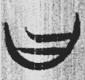曰
